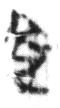○（食）
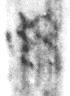母
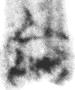齊（劑）
